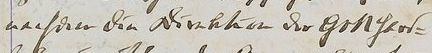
nachdem die Direktion der Gotthard-
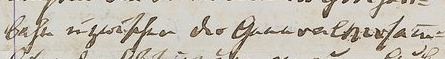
bahn inzwischen der Generalversamm-
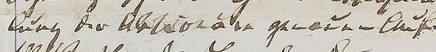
lung der Aktionäre genauen Auf-
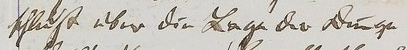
schluß über die Lage der Dinge
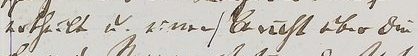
abschließlichen Bericht über die
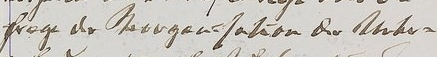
Frage der Reorganisation der Unter-
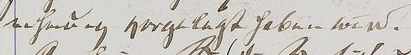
nehmung vorgelegt haben wird.
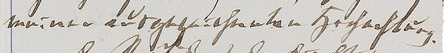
meiner ausgezeichneten Hochachtung.
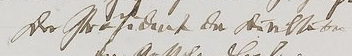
Der Präsident der Direktion
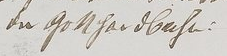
der Gotthardbahn:
